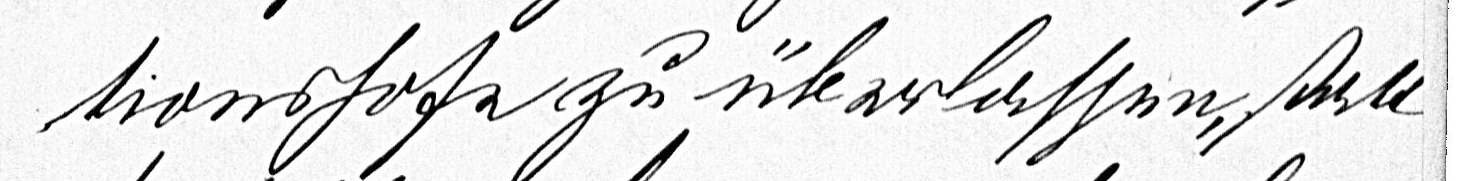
tionshofe zu überlassen, statt
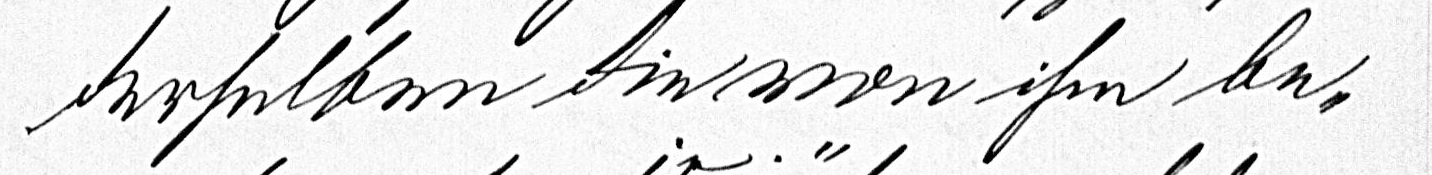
derselben die von ihm be¬
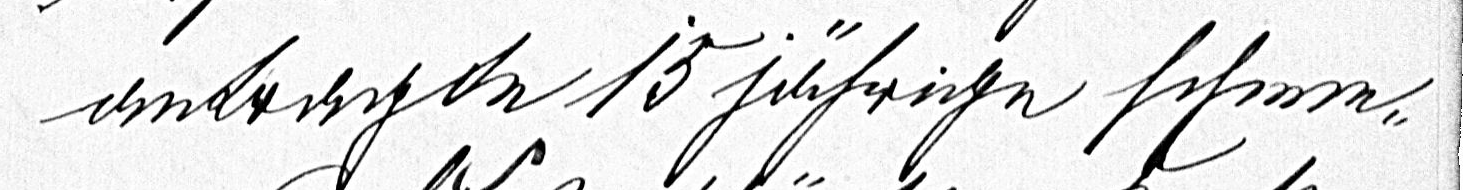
antragte 15jährige schwe¬
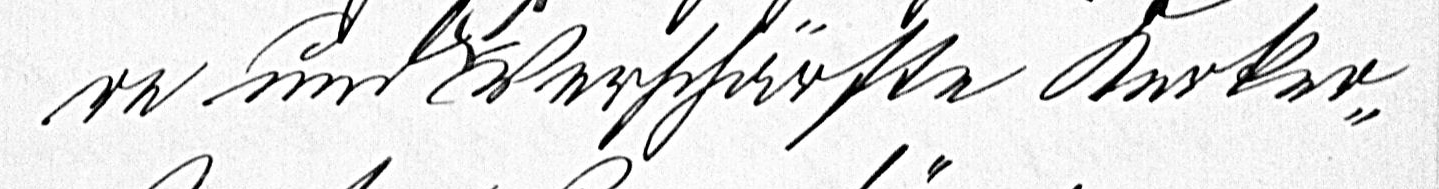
re und xx Verschärfte Kerker¬
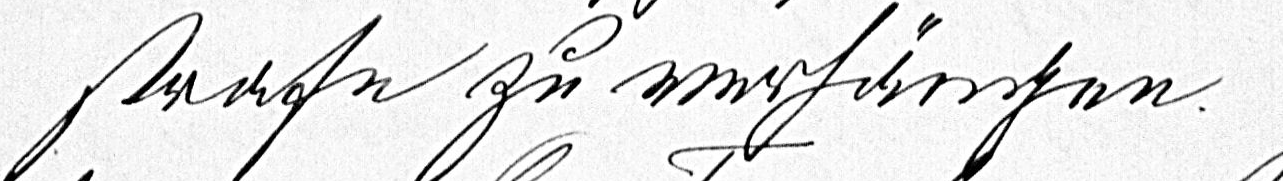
strafe zu verhängen.
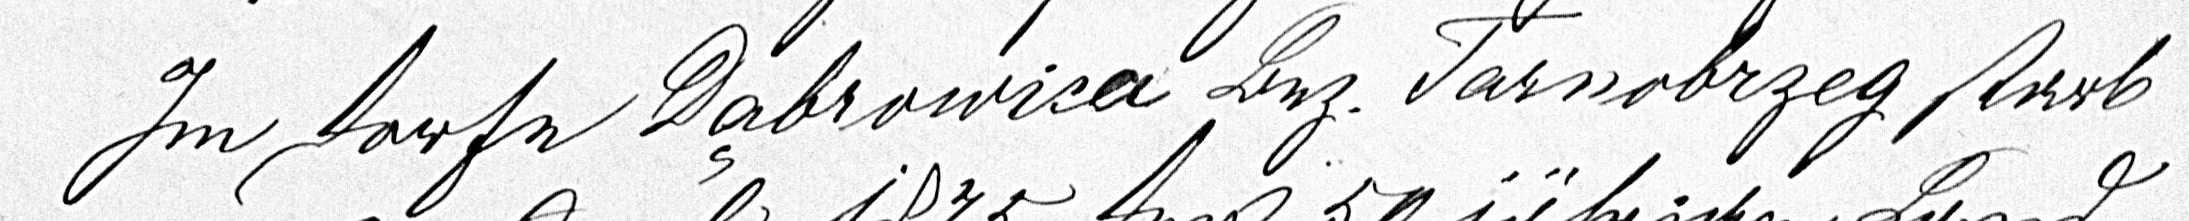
Im Dorfe Dabrowicz Bez. Tarnobrzeg starb
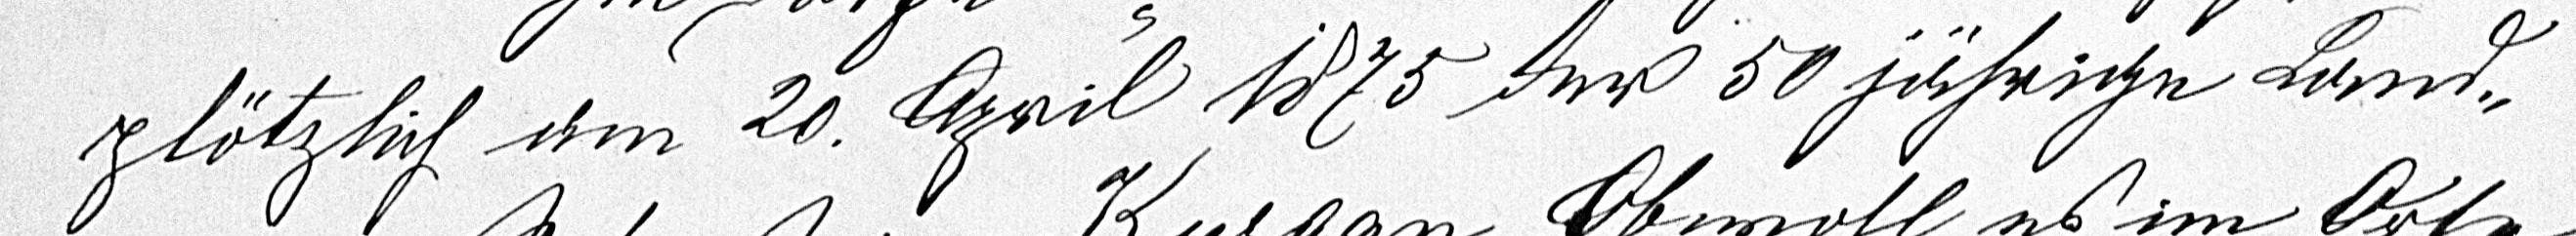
plötzlich am 20. April 1875 der 50 jährige Land¬
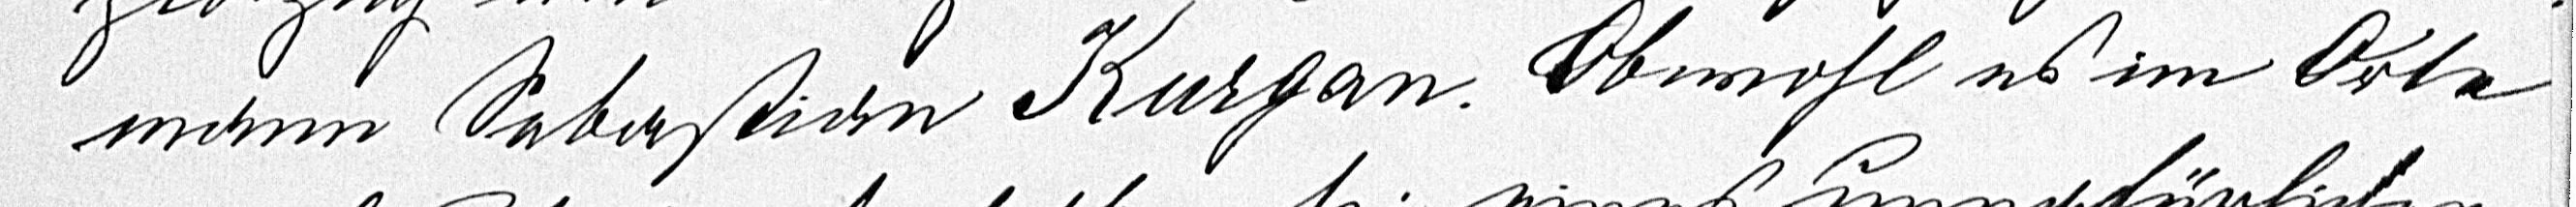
mann Sebastian Kurgan. Obwohl es im Orte
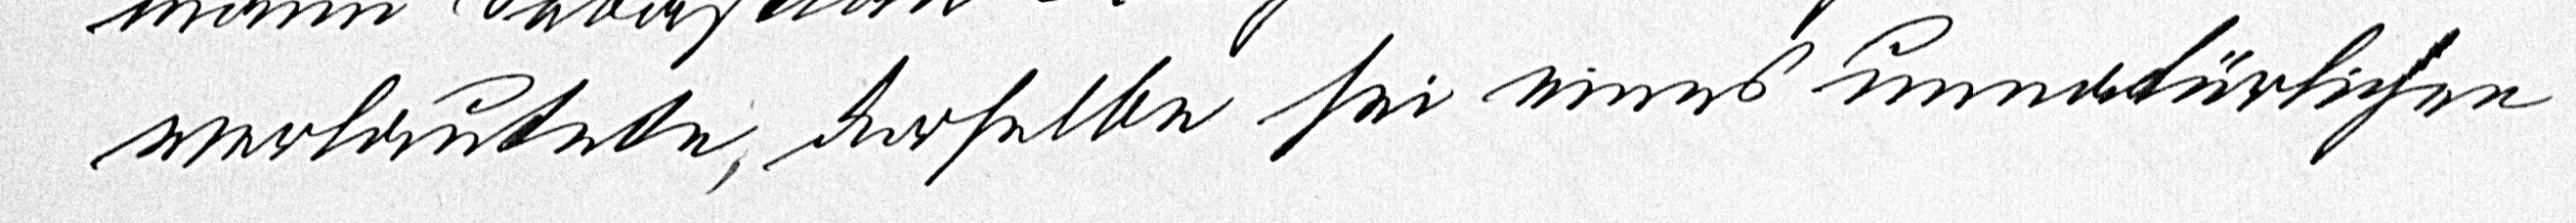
verlautete, derselbe sei eines unxxtürtichen
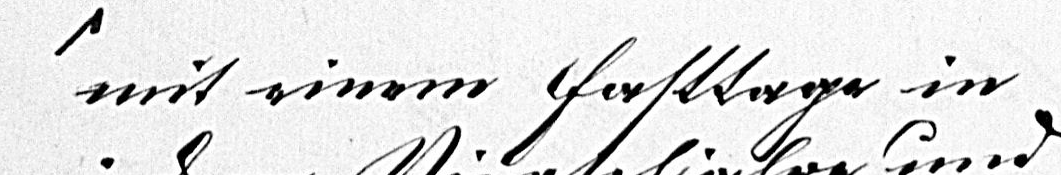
mit einem Hafttage in
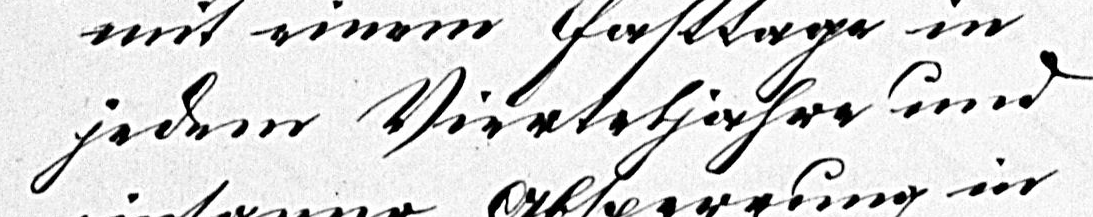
jedem Viertejahre und
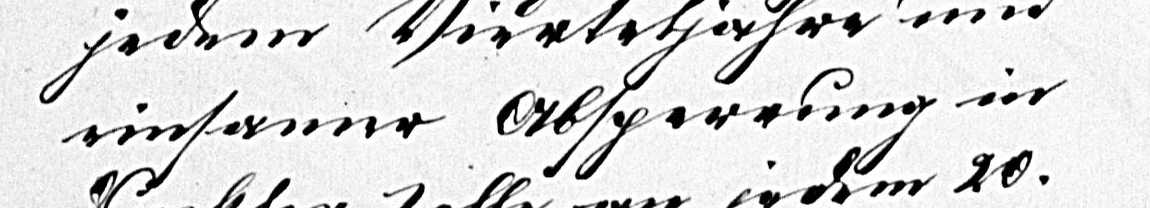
einsamer Absperrung in
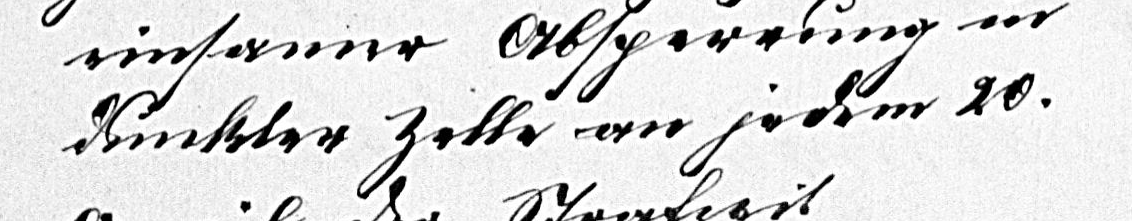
Dunkler Zelle an jedem 20.
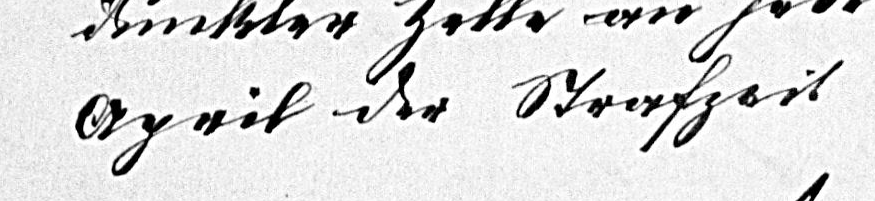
April der Strafzeit
